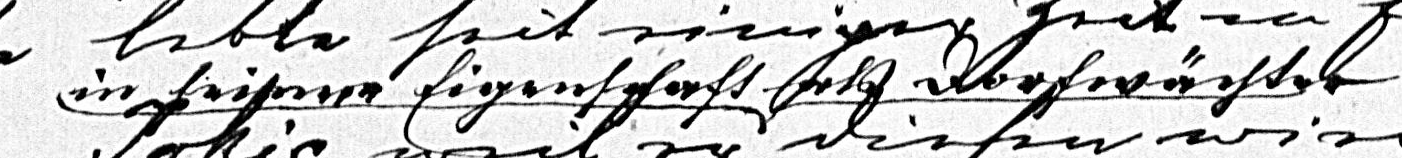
in xx Eigenschaft als Dorfwächter
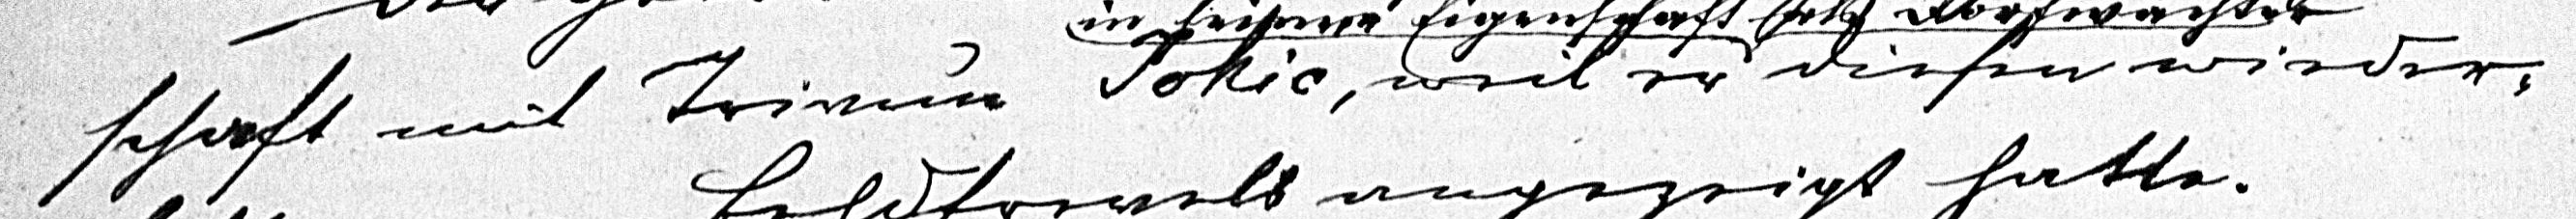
schaft mit Trivun Jokic, weil er diesen wieder¬
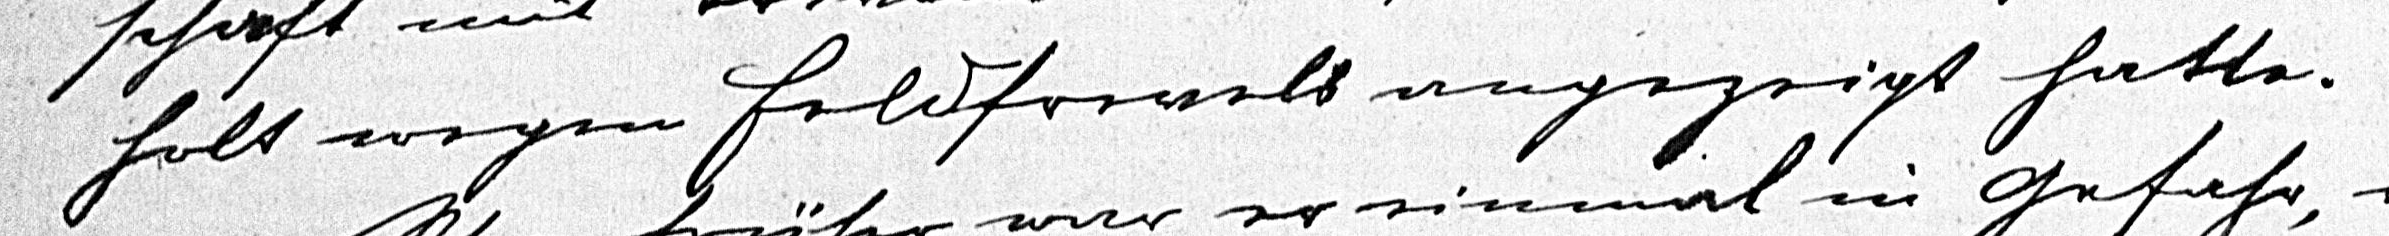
holt wegen Feldfrevels angezeigt hatte.
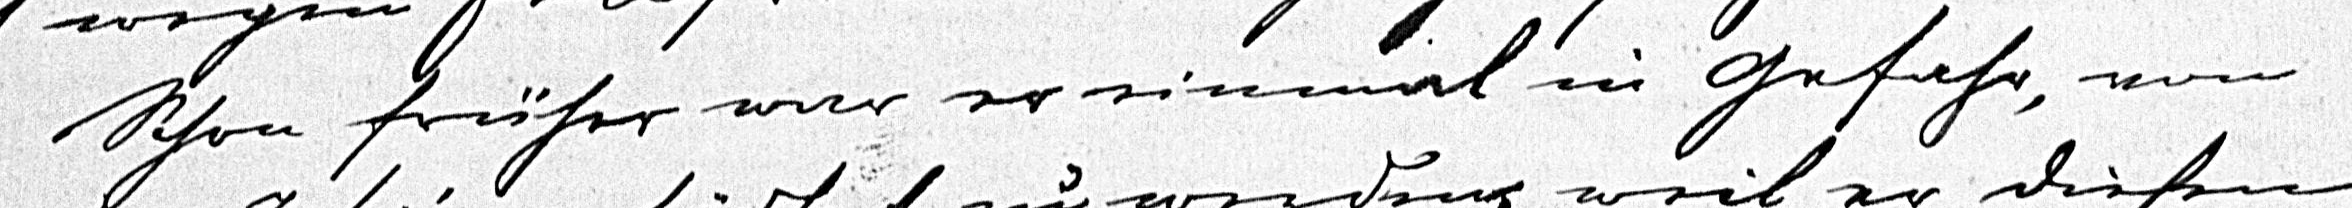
Schon früher war er einmal in Gefahr, von
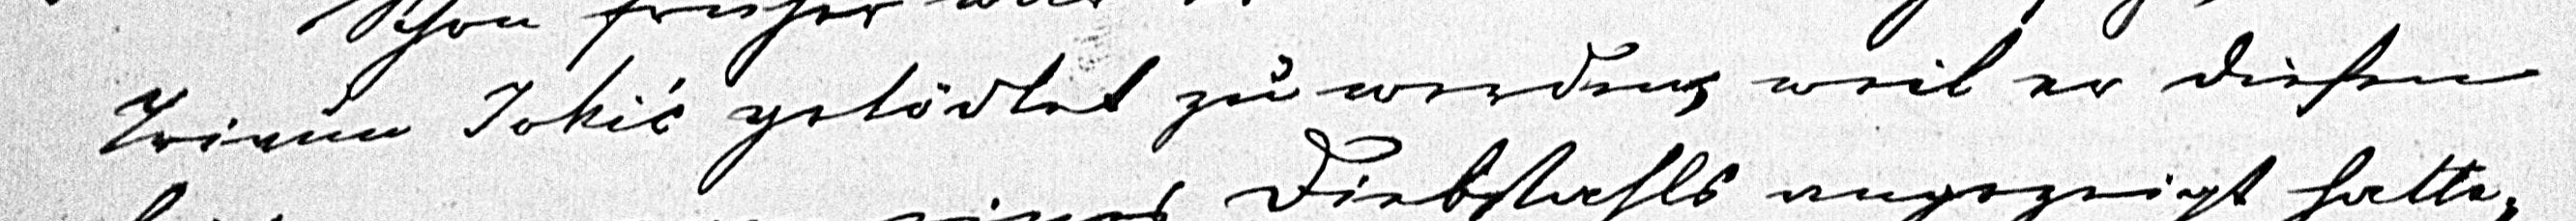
Trivun Jokić getödtet zu werden, weil er diesen
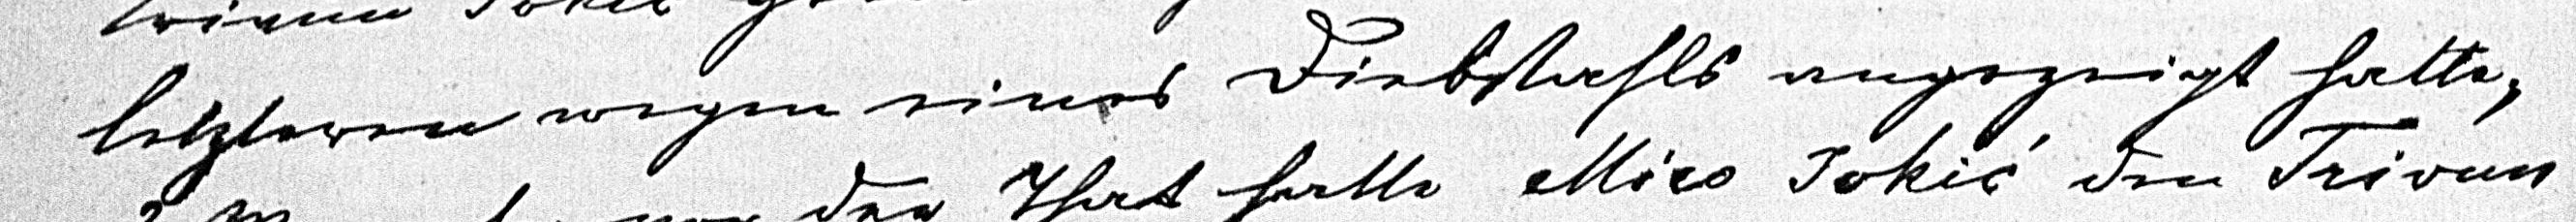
letzteren wegen eines Diebstahls angezeigt hatte,
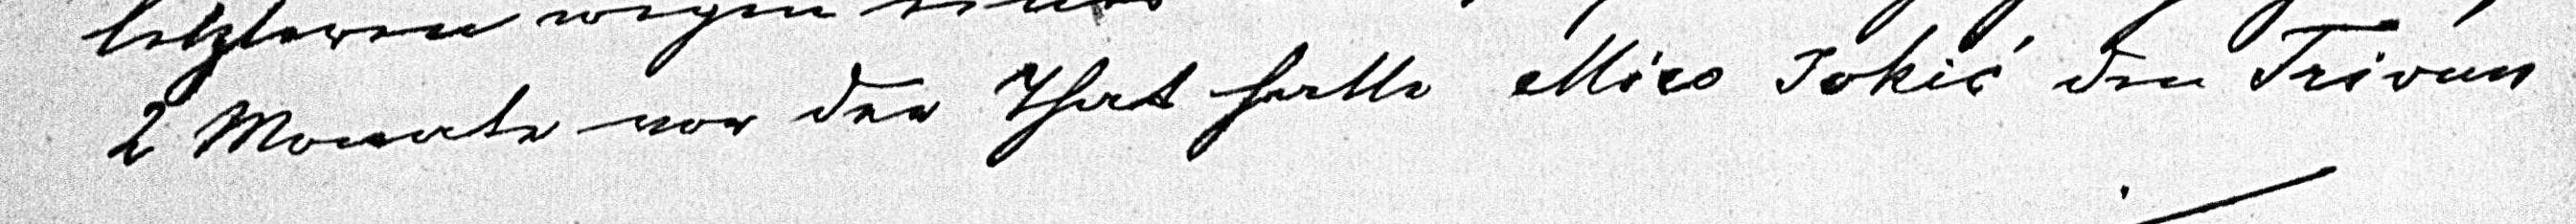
2 Monate vor der That hatte Mico Jokić den Trivun
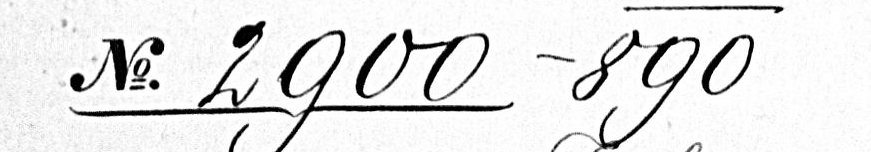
Nr. 2900-890
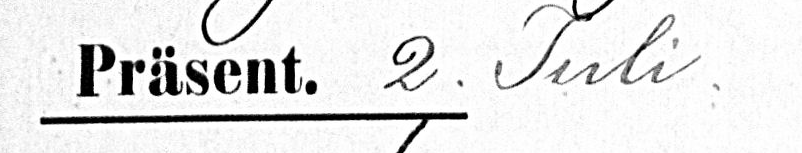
Präsent. 2. Juli.
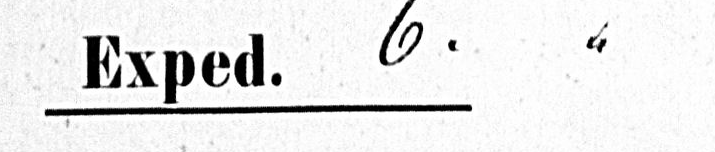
Exped. 6. Juli
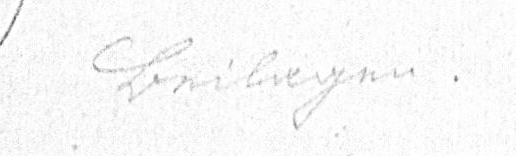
Beilagen.
